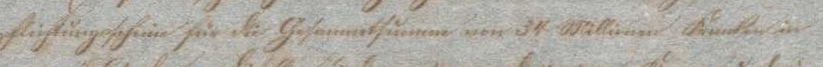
pflichtungsscheine für die Gesammtsumme von 34 Millionen Franken in
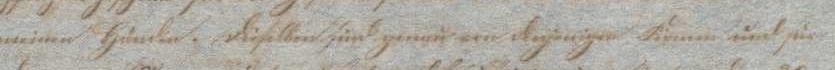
meinen Händen. Dieselben sind genau von denjenigen Firmen und für
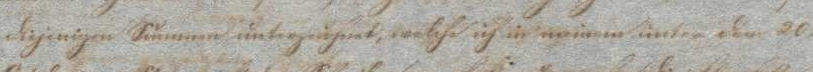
diejenigen Summen unterzeichnet, welche ich in meinem unter dem 20.
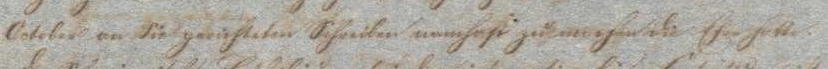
October an Sie gerichteten Schreiben namhaft zu machen die Ehre hatte.
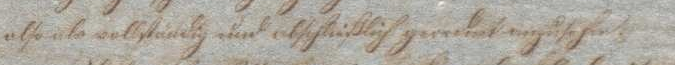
also als vollständig und abschließlich geordnet anzusehen.
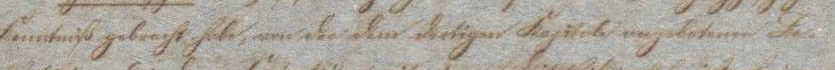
Kenntniß gebracht habe, von der dem dortigen Kapitale angebotenen Be-
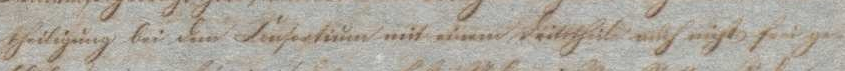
theiligung bei dem Consortium mit einem Dritttheile auch nichts frei ge-
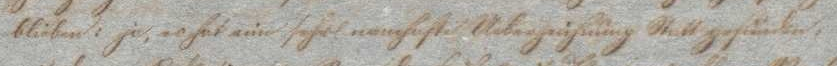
bleiben: ja, es hat eine sehr namhafte Ueberzeichnung Statt gefunden,
